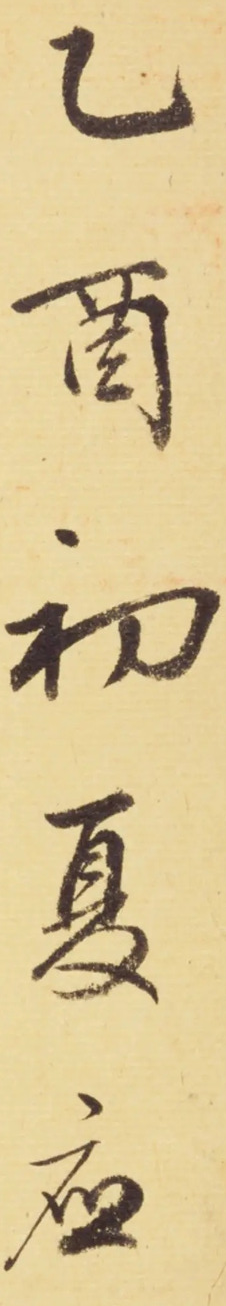乙酉初夏応
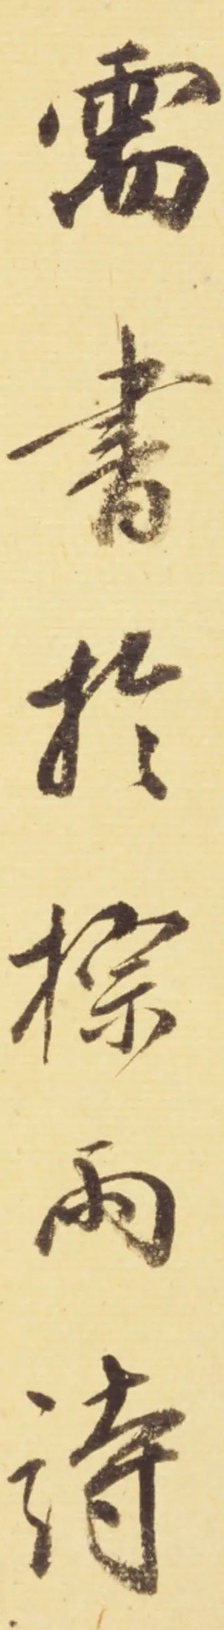需書於棕雨詩
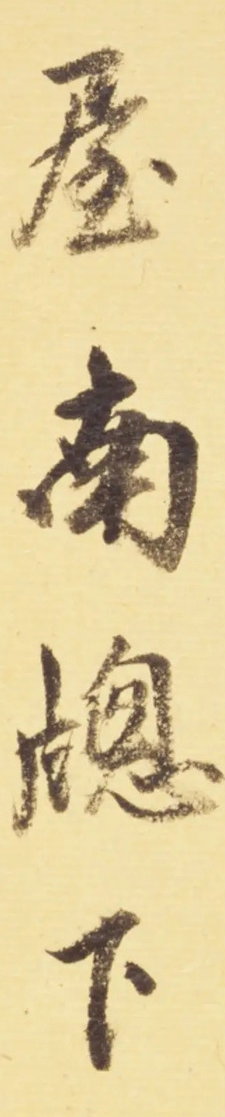屋南牕下
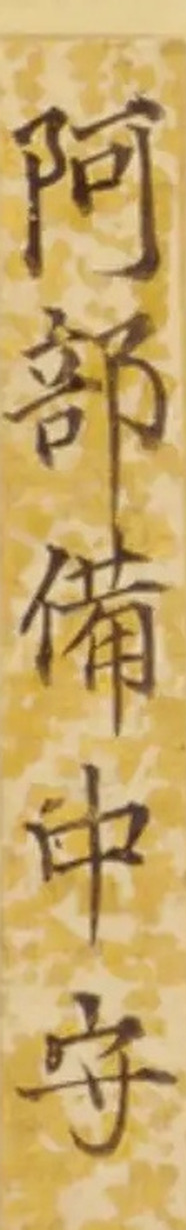阿部備中守

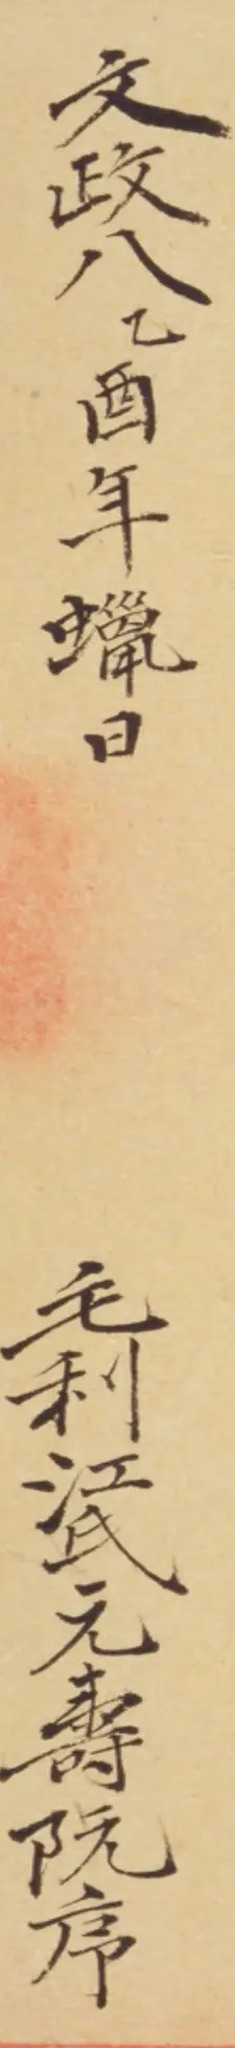文政八乙酉年蠟日毛利江氏元寿阮序

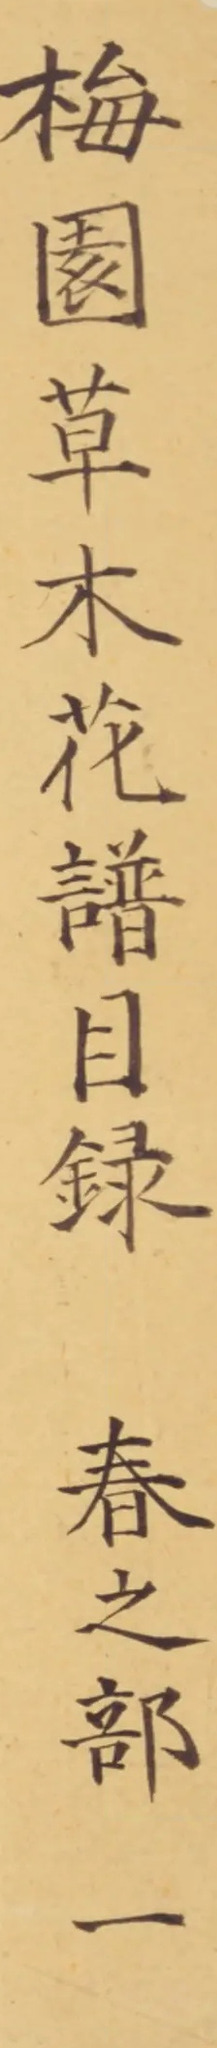梅園草木花譜目録春の部一
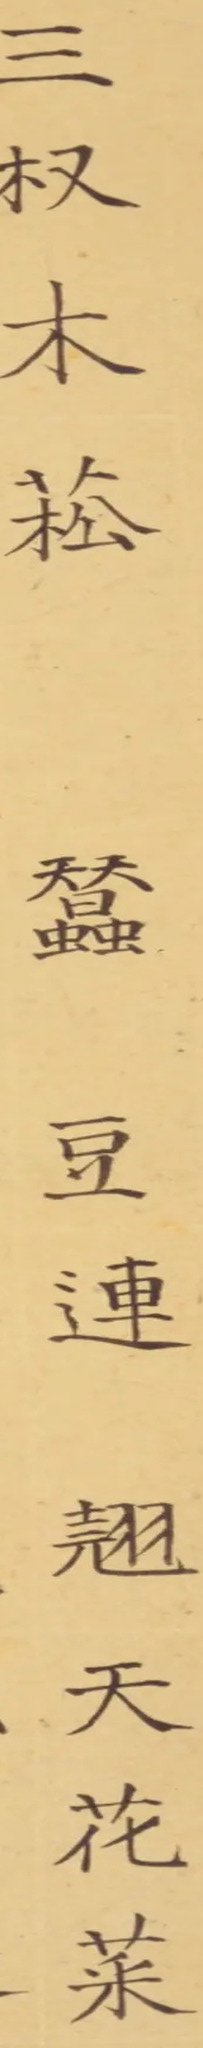三杈木菘蚕豆連翹天花菜
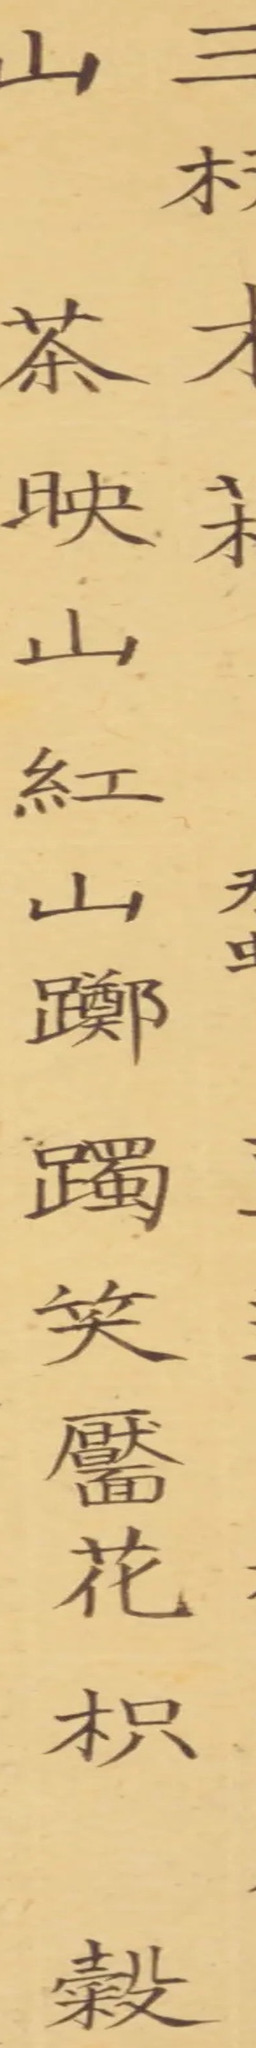山茶映山紅山躑躅笑靨花枳殻
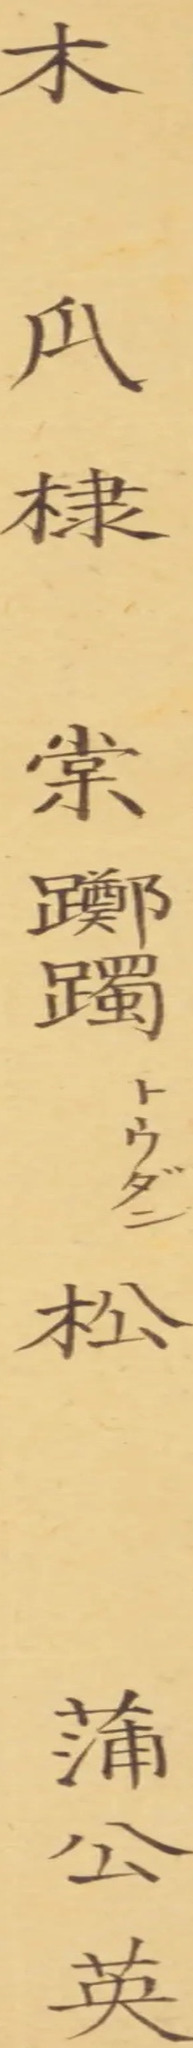木瓜棣棠躑躅ドウダン松蒲公英
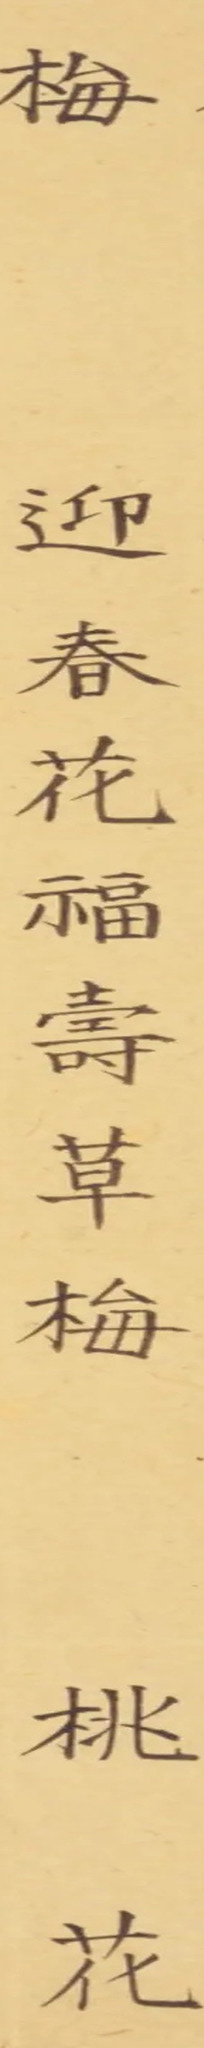梅迎春花福寿草梅桃花
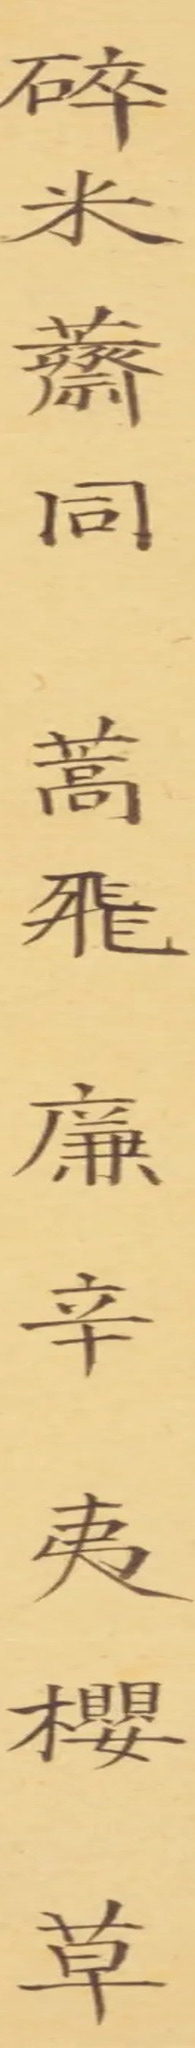砕米薺同蒿飛廉辛夷桜草
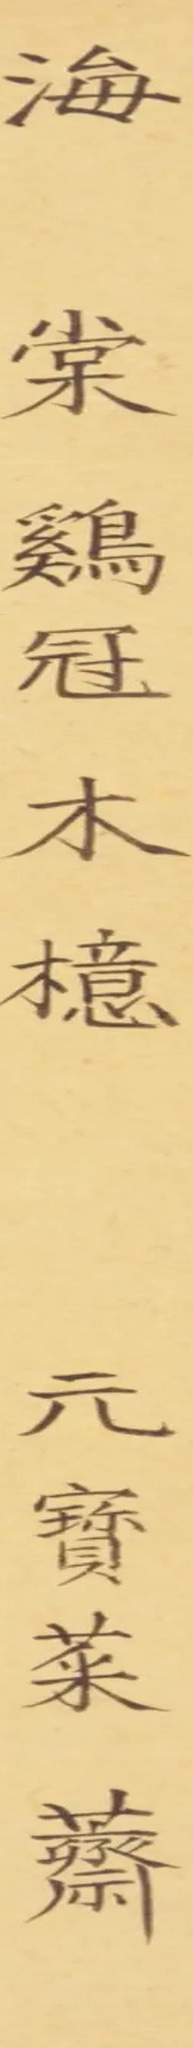海棠鶏冠木檍元宝菜薺
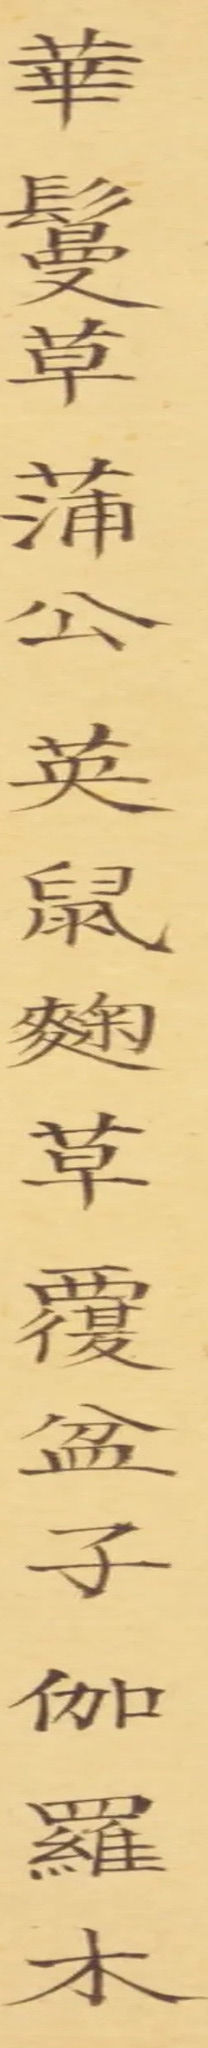華鬘草蒲公英鼠麹草覆盆子伽羅木
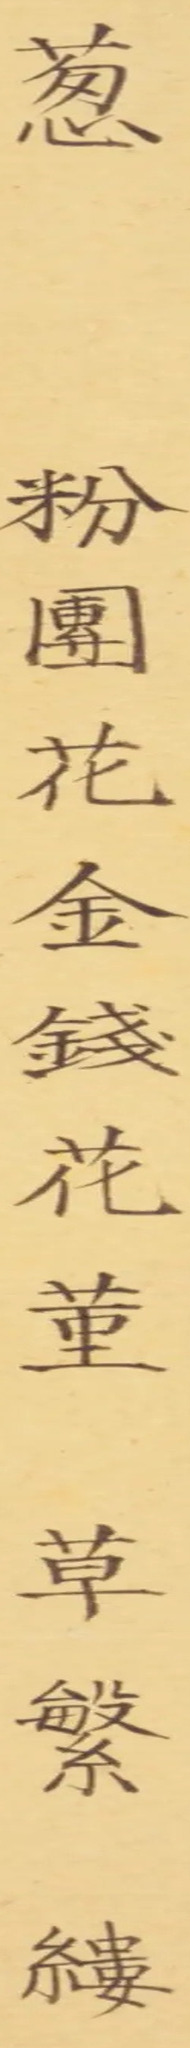葱粉団花金錢花菫草繁縷
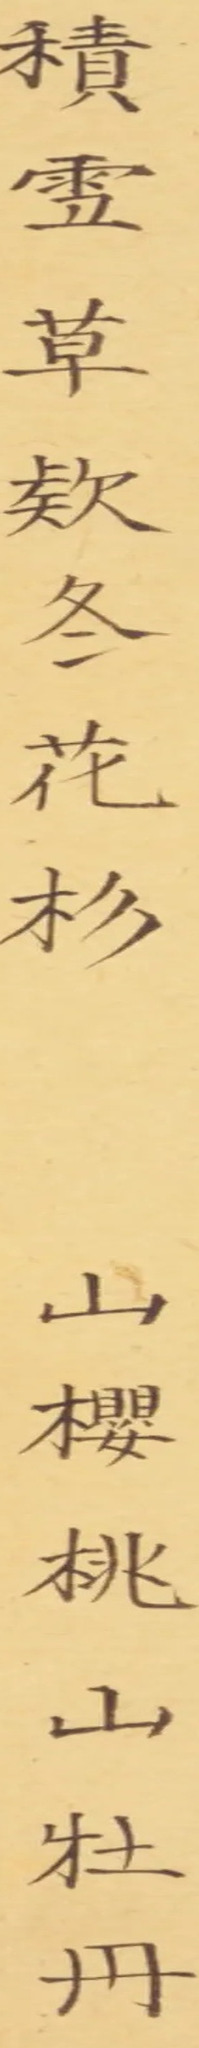積雪草款冬花杉山桜桃山牡丹
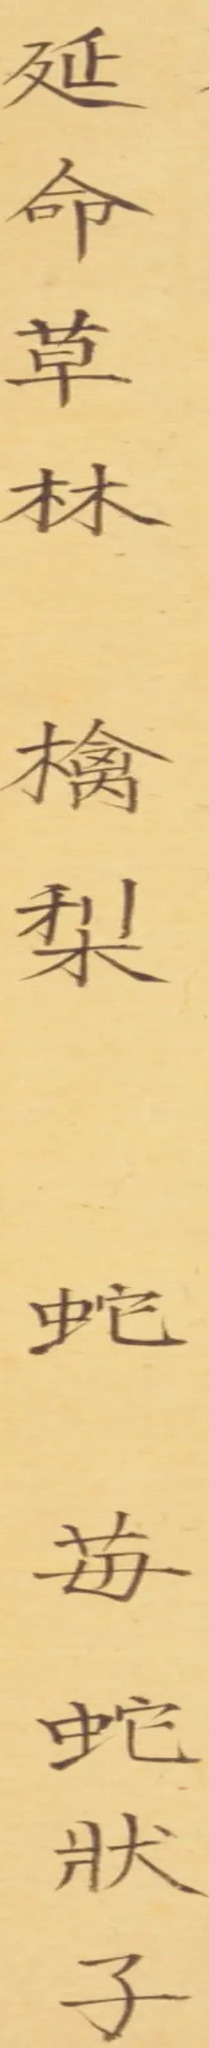延命草林檎梨蛇苺蛇状子
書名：梅園草木花譜春之部. 1
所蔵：国立国会図書館 National Diet Library, JAPAN
